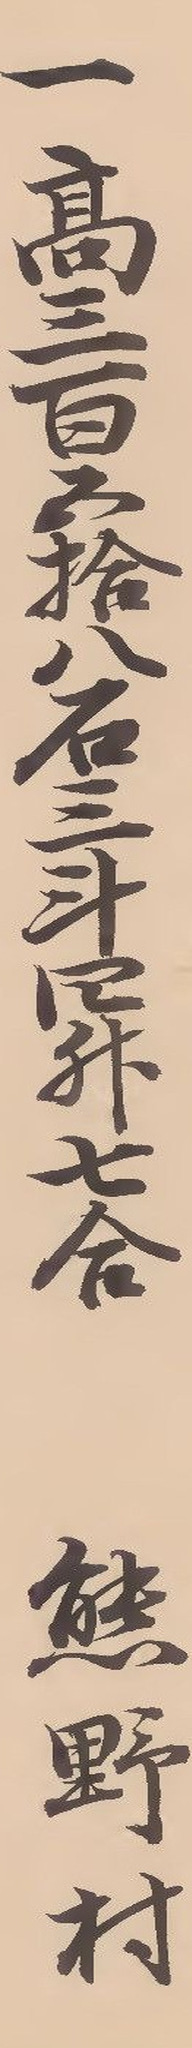一高三百五拾八石三斗四升七合熊野村
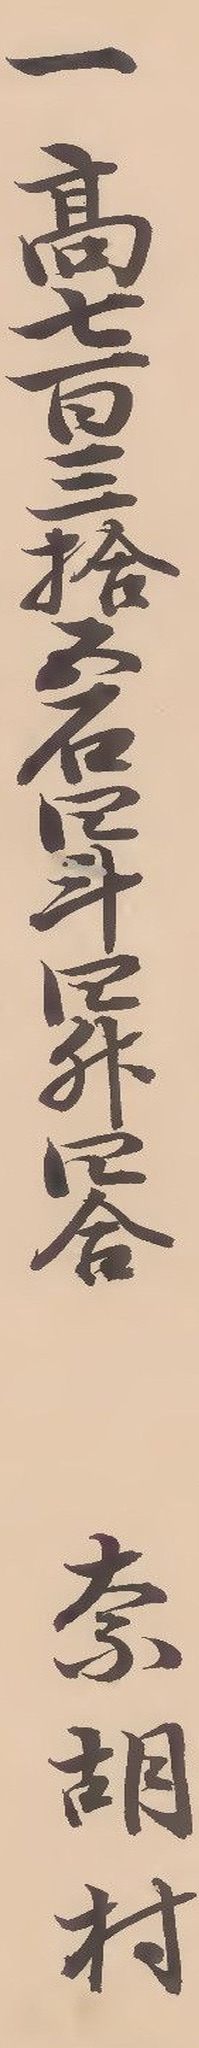一高七百三拾五石四斗四升四合奈胡村

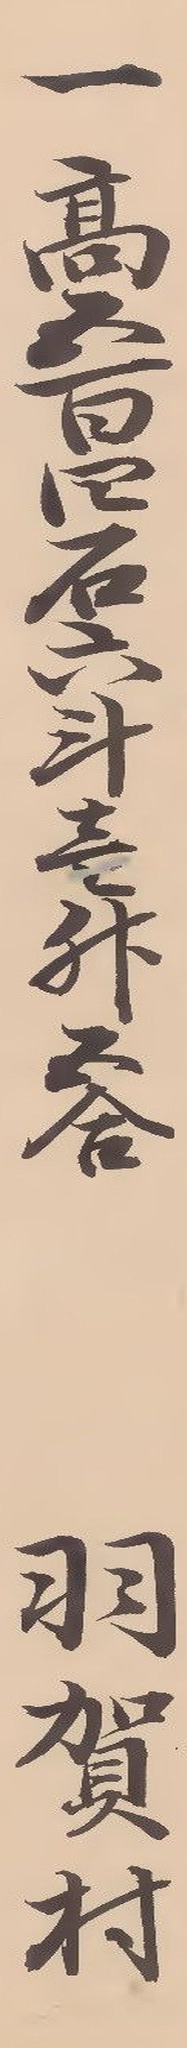一高五百四石六斗壱升五合羽賀村
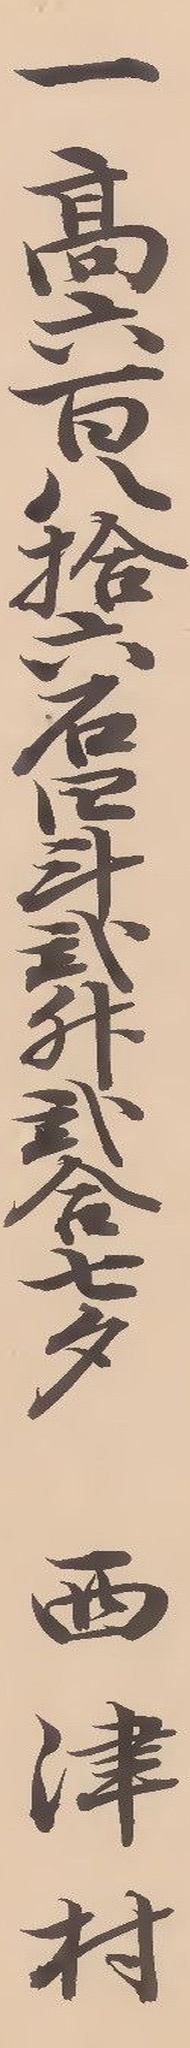一高六百八拾六石四斗弐升弐合七勺西津村
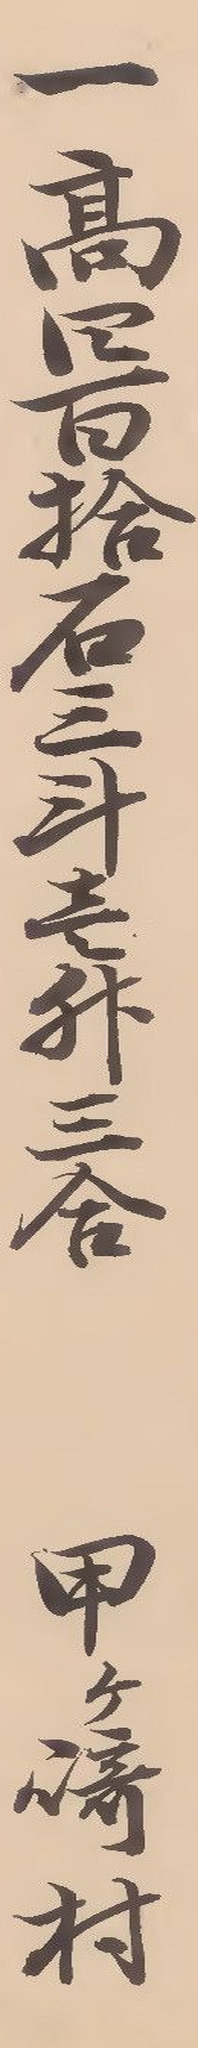一高四百拾石三斗壱升三合甲ヶ崎村
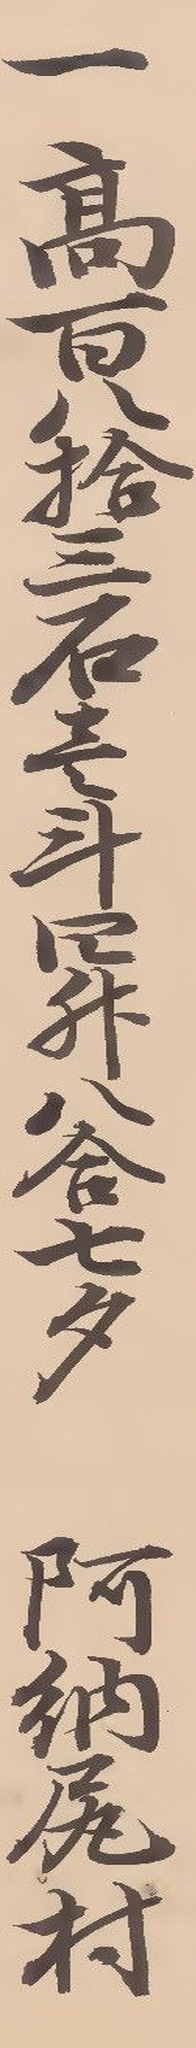一高百八拾三石壱斗四升八合七勺阿納尻村
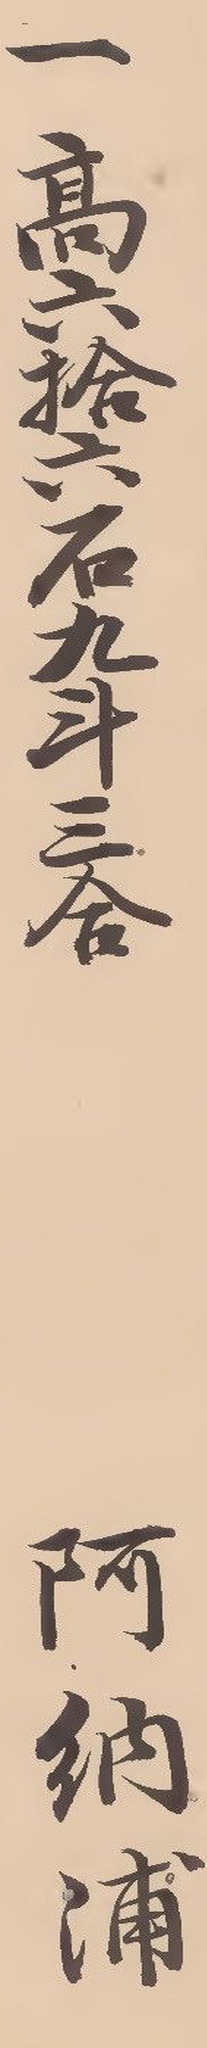一高六拾六石九斗三合阿納浦
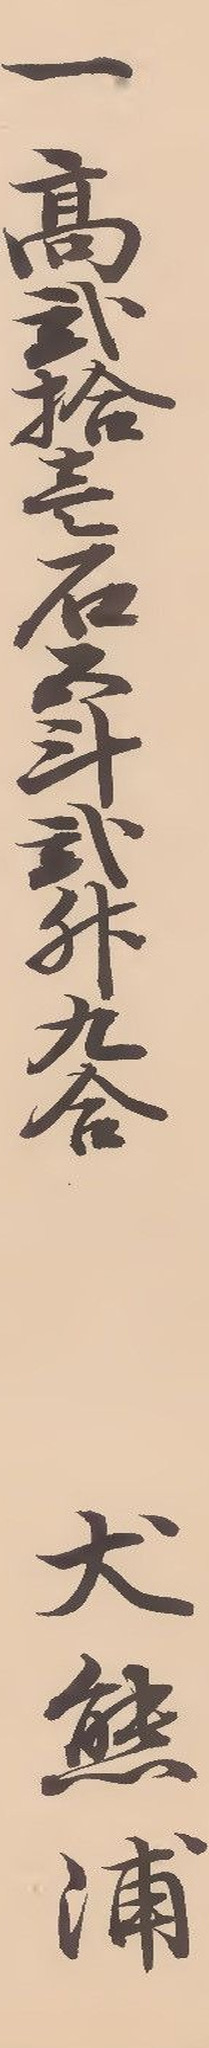一高弐拾壱石五斗弐升九合犬熊浦
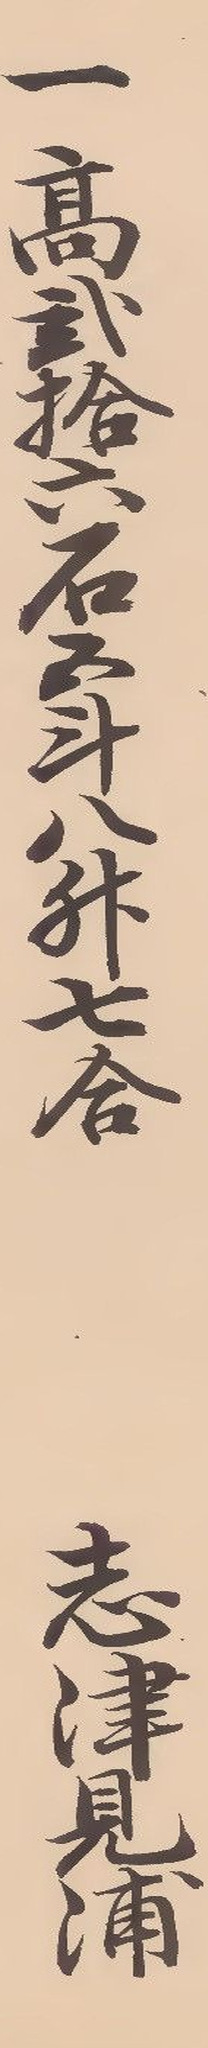一高弐拾六石五斗八升七合志津見浦
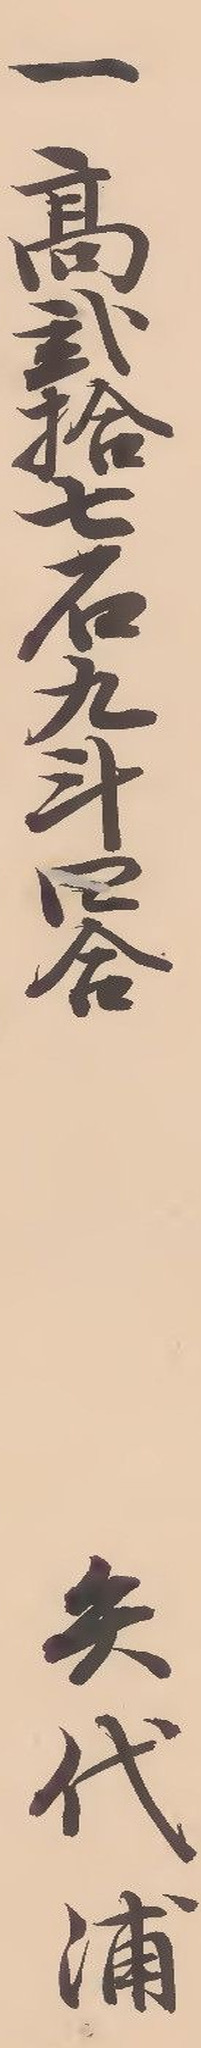一高弐拾七石九斗四合矢代浦

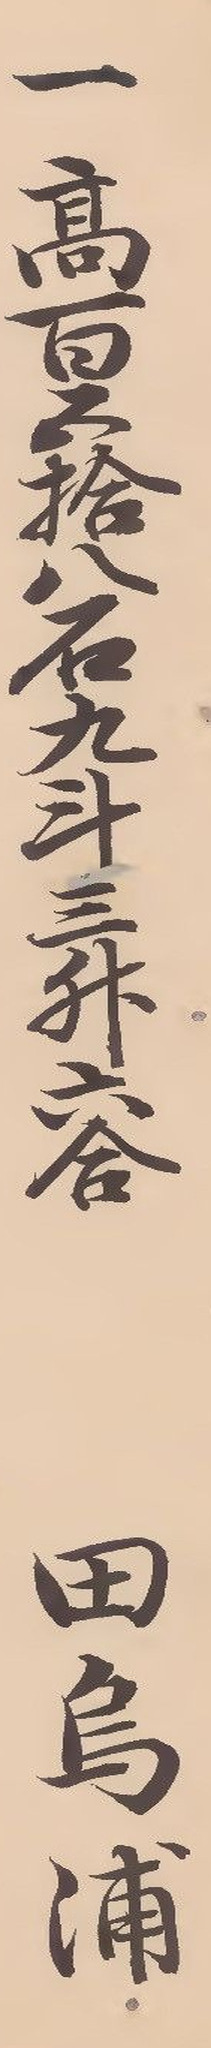一高百五拾八石九斗三升六合田烏浦
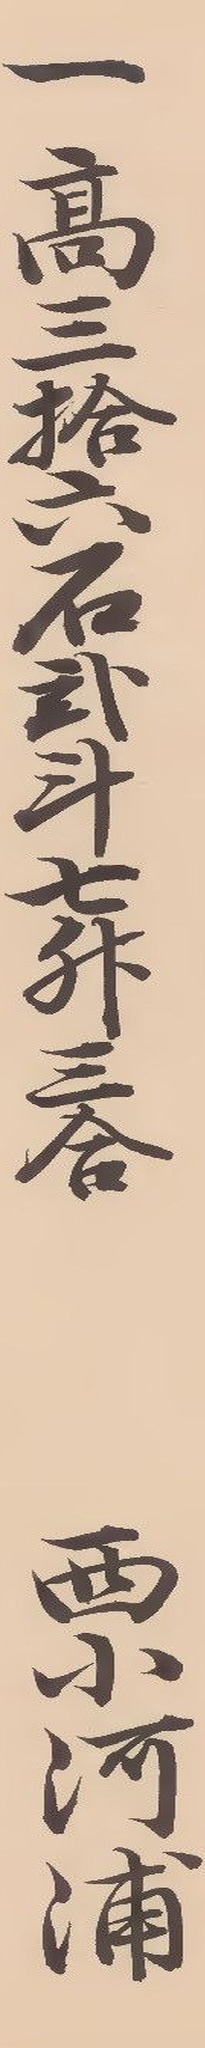一高三拾六石弐斗七升三合西小河浦
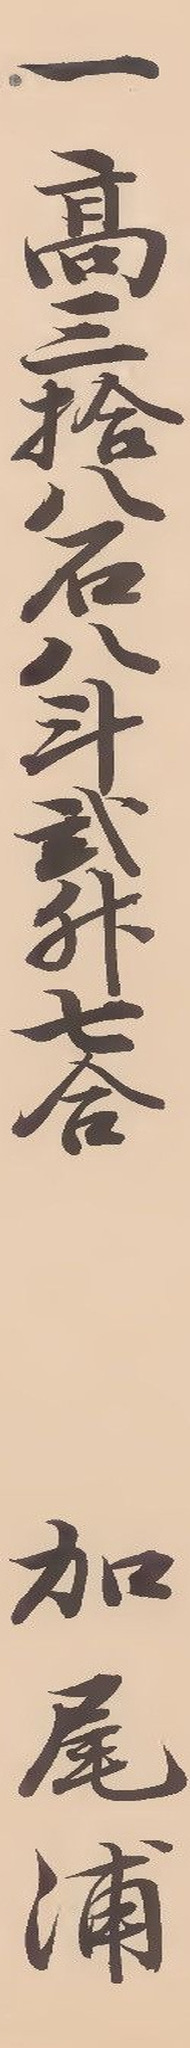一高三拾八石八斗弐升七合加尾浦
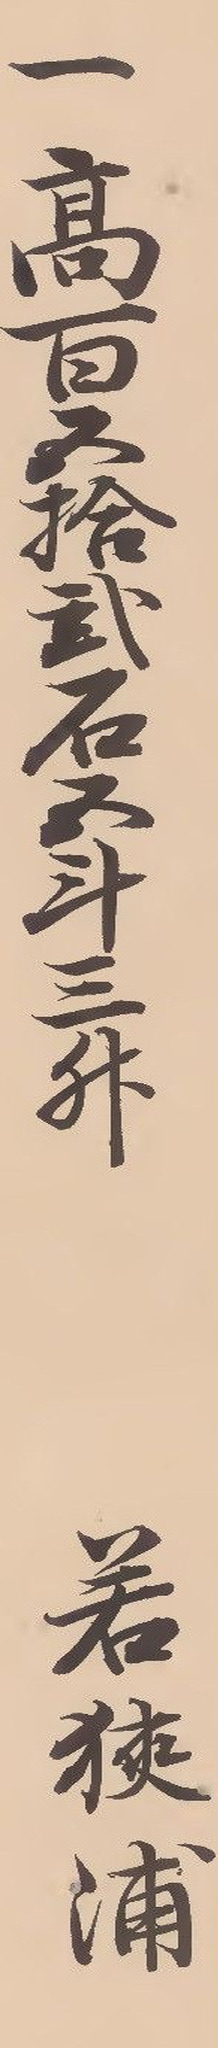一高百五拾弐石五斗三升若狭浦
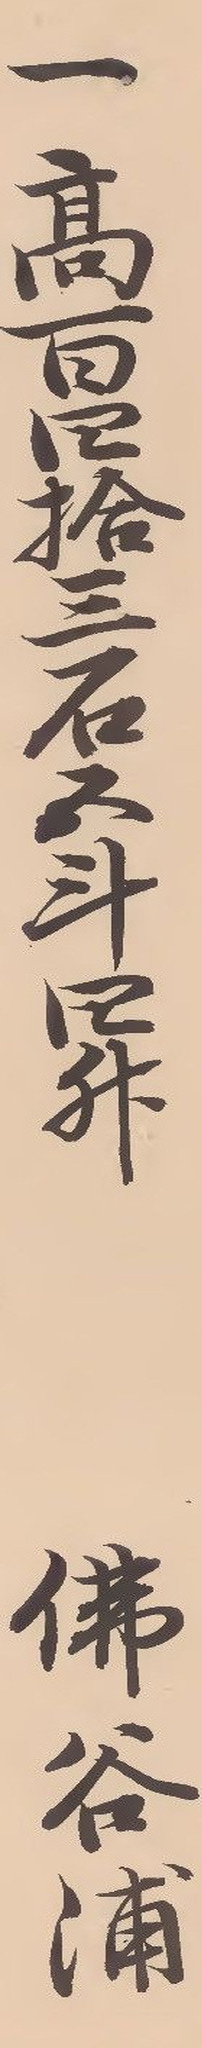一高百四拾三石五斗四升仏谷浦
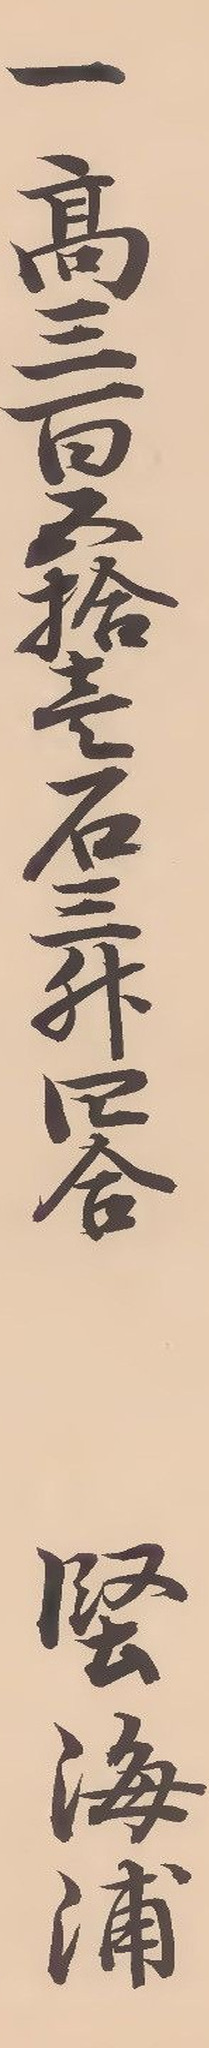一高三百五拾壱石三升四合堅海浦
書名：若狭国郷帳
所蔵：国立公文書館 National Archives of Japan
